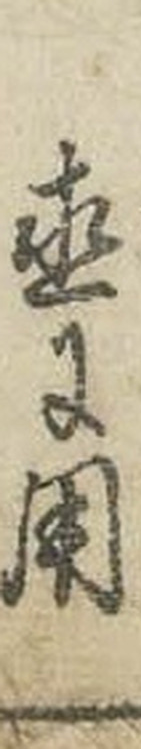直に用
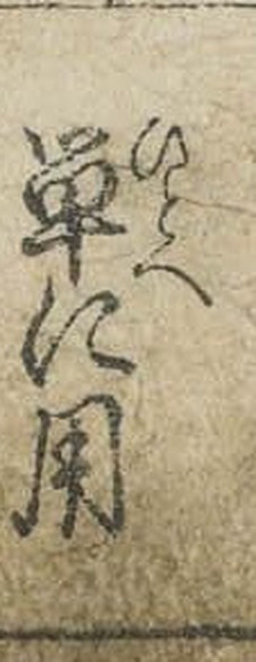単に用

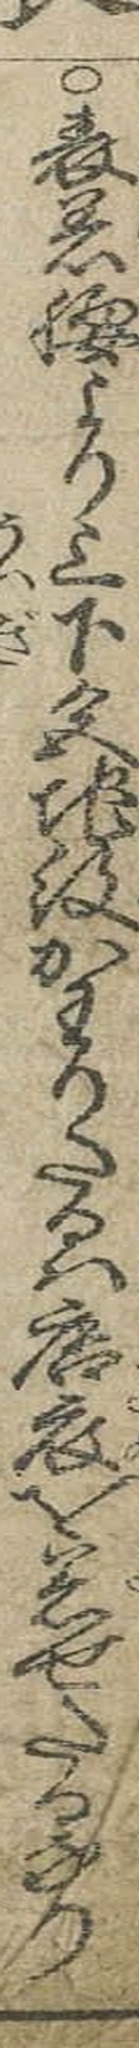○表着腰より上下色地紋かわりたるは唐衣を着せたるなり
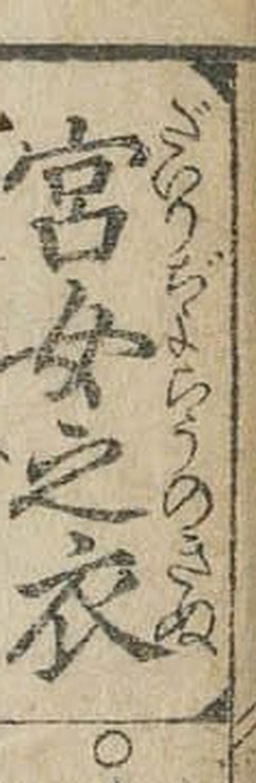宮女之衣
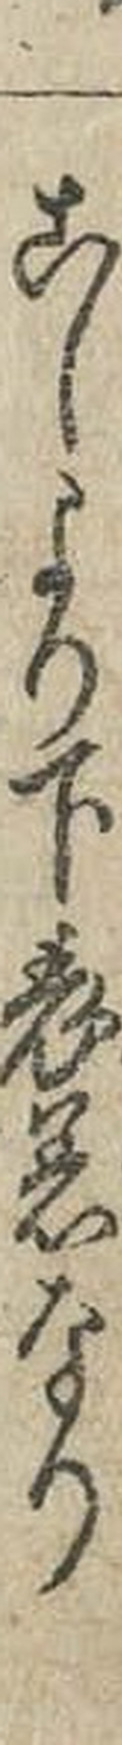こしより下表着なり
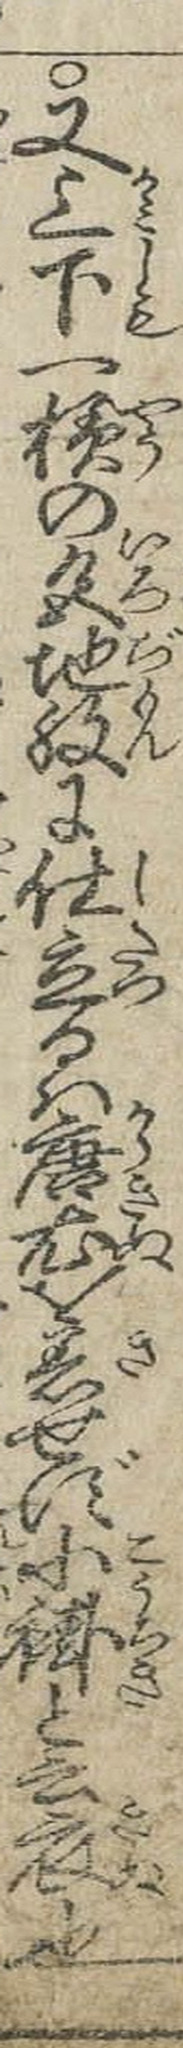○又上下一様の色地紋に仕立るは唐衣を着せず小褂と云衣也
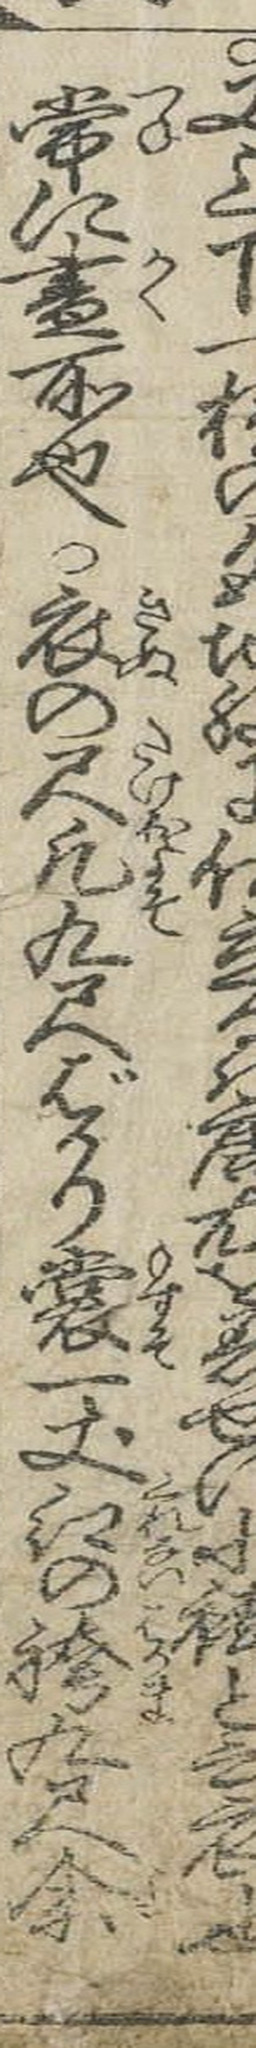常に畫所也○衣の尺凡九尺ばかり裳一丈紅の袴九尺余
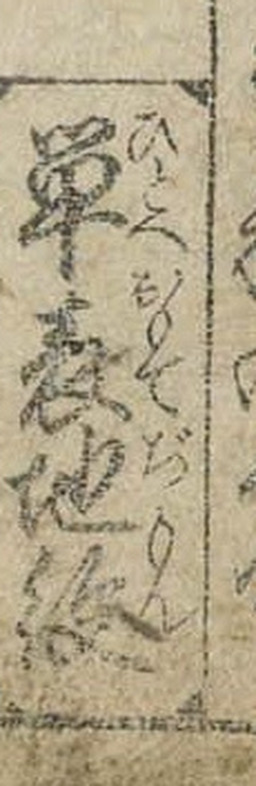単表地門
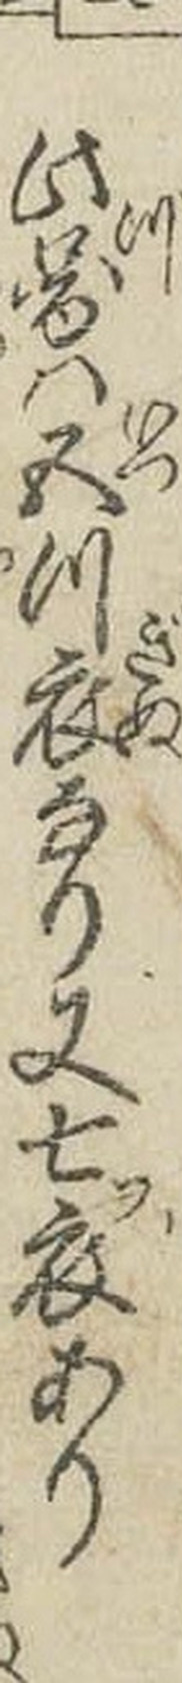此図は五つ衣なり又七ッ衣あり
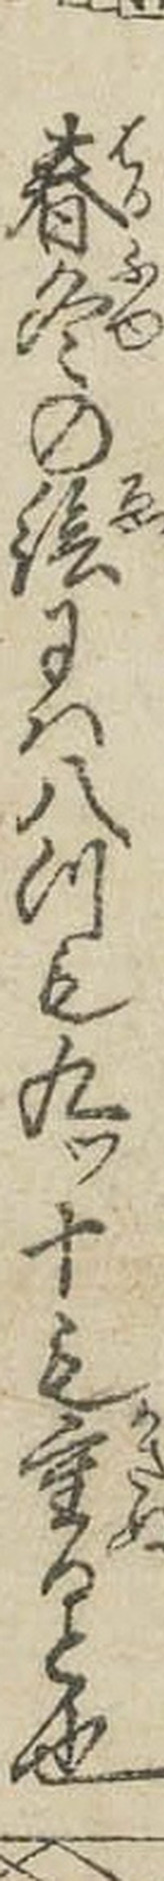春冬の絵には八つも九ッ十も重ると也
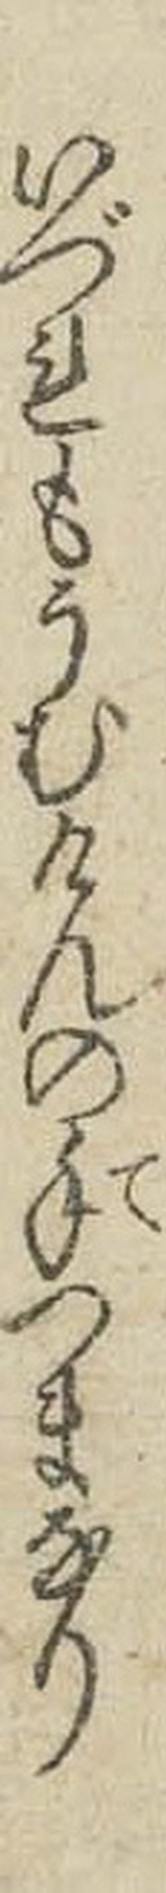いづれもうむけんの手つまなり
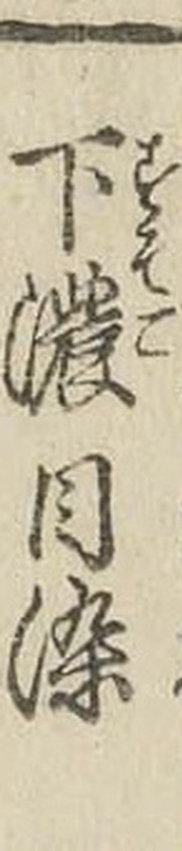下濃目染

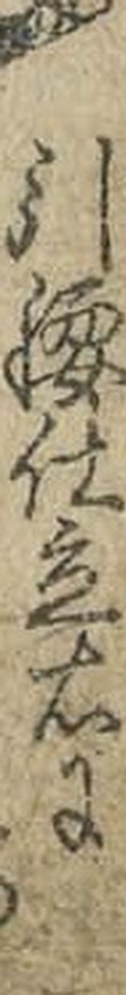引腰仕立右に
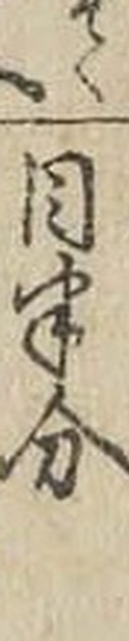目半分
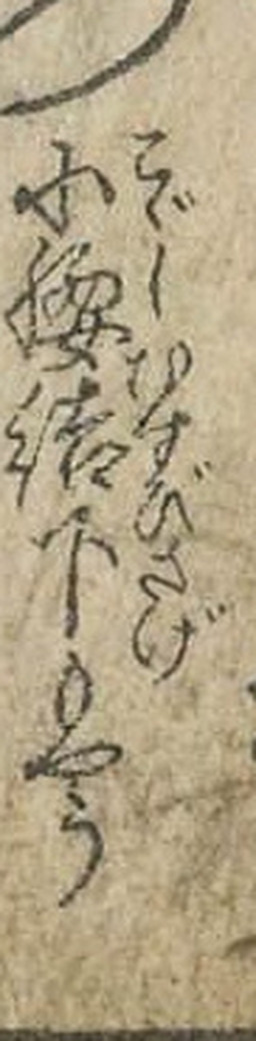小腰結下もやう
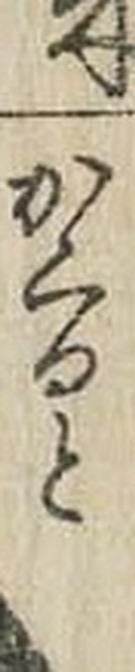かくると
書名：絵本写宝袋 9巻 1之巻
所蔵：東京学芸大学教育コンテンツアーカイブ
